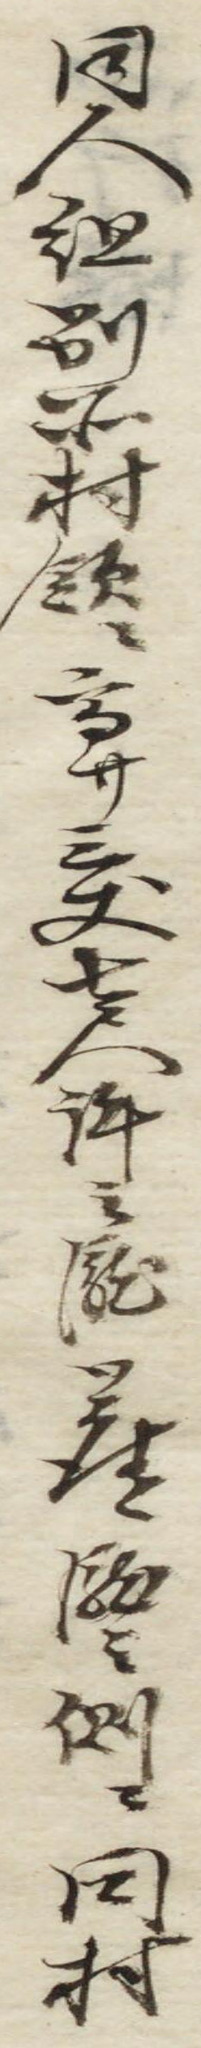同人組別所村領に高さ七尺許之瀧御座候瀧之側に同村
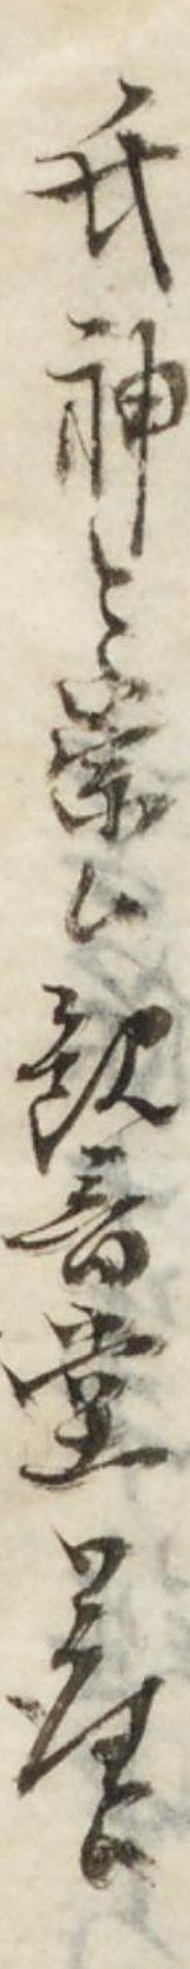氏神と崇む観音堂御座候
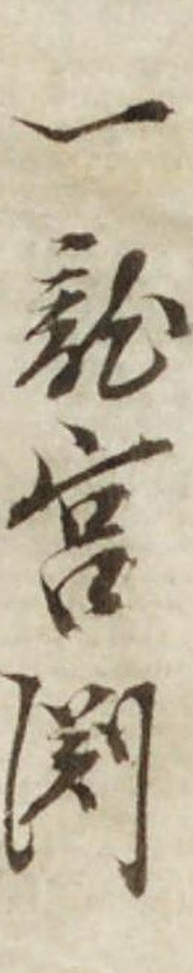一龍宮淵
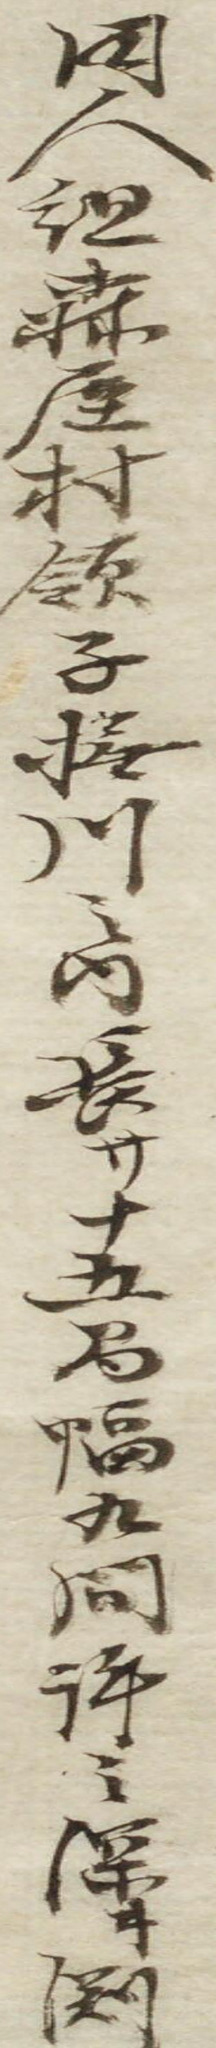同人組森屋村領子撫川之内長さ十五間幅九間許之深き淵
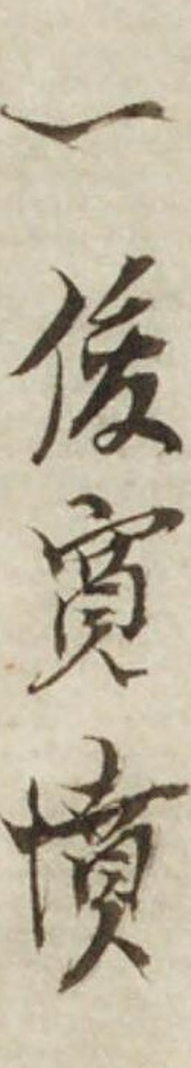一俊寛墳
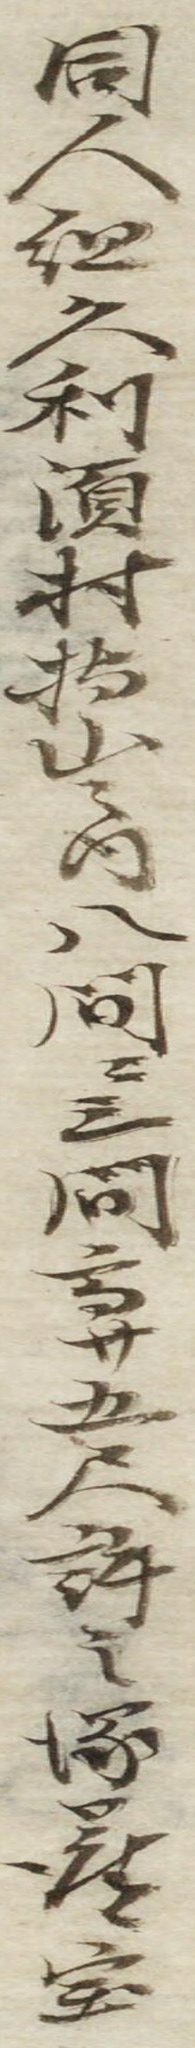同人組久利須村持山之内八間に三間高さ五尺許之塚御座候宝
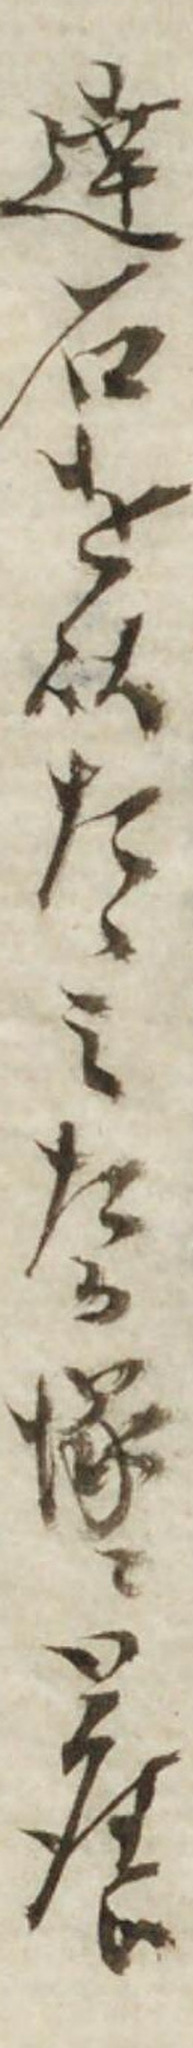達石を以たゝ之たか塚に御座候
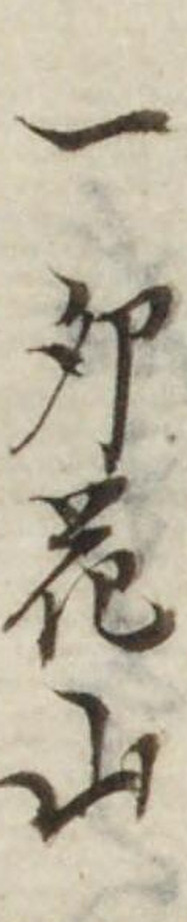一卯花山
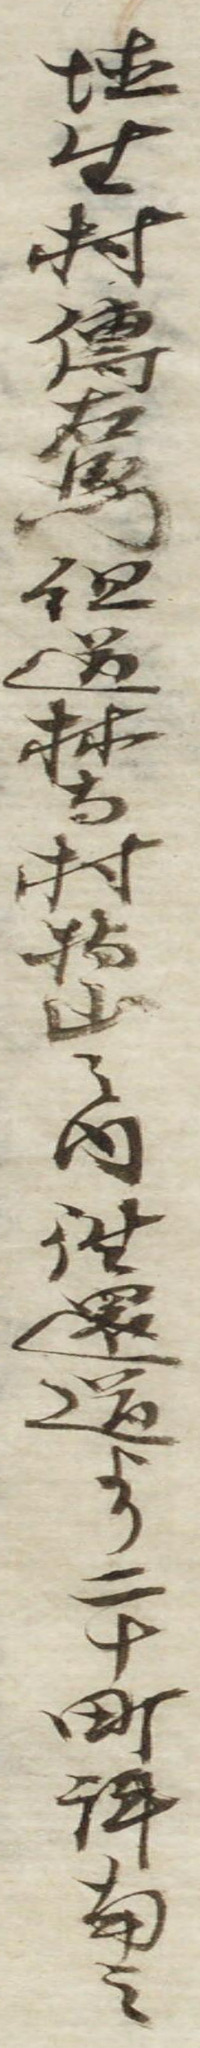植生村伝右衛門組道林寺村持山之内往還道より二十町許南之
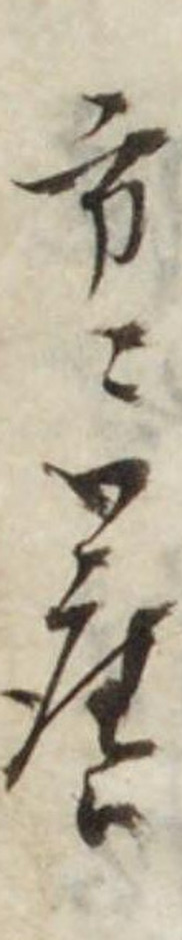方に御座候
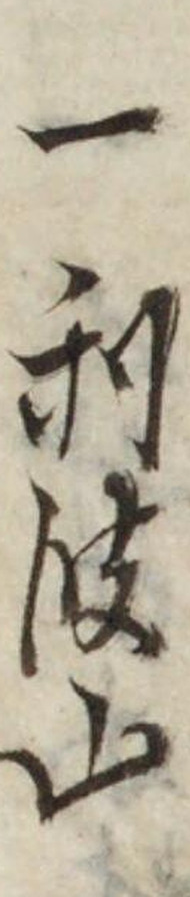一利波山
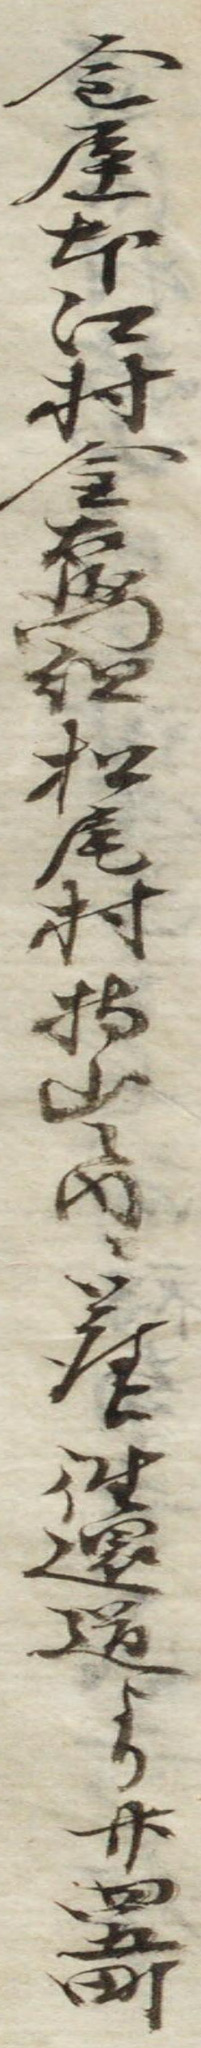金屋本郷村金右衛門組松尾村持山之内に御座候往還道より廿四五町
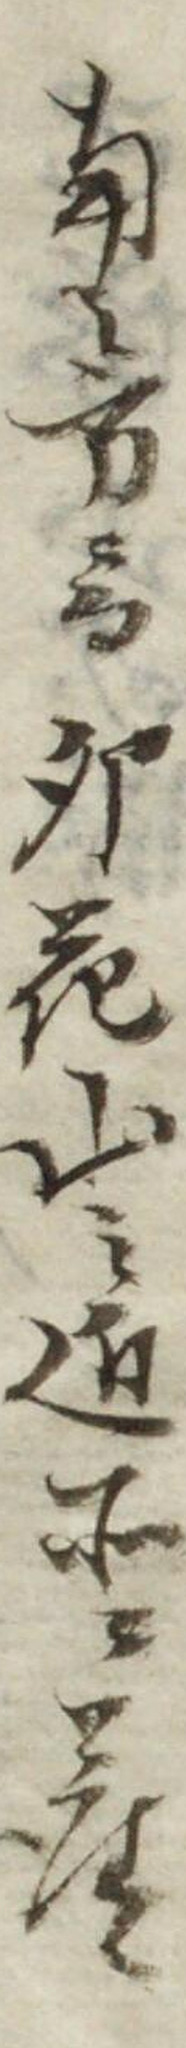南之方に而卯花山之近所に御座候
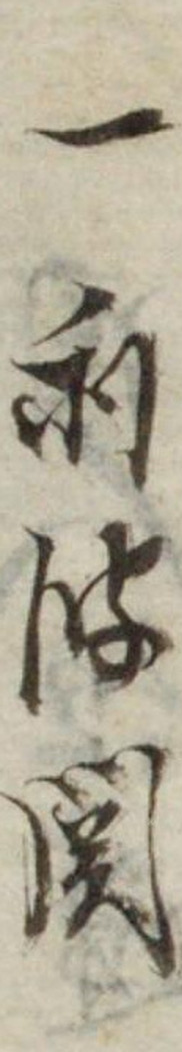一利波関

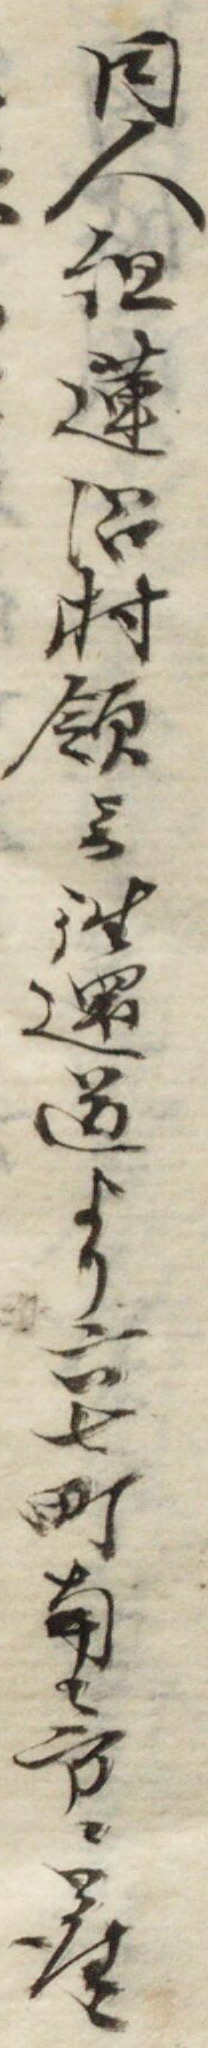同人組蓮沼村領に而往還道より六七町南之方に御座候
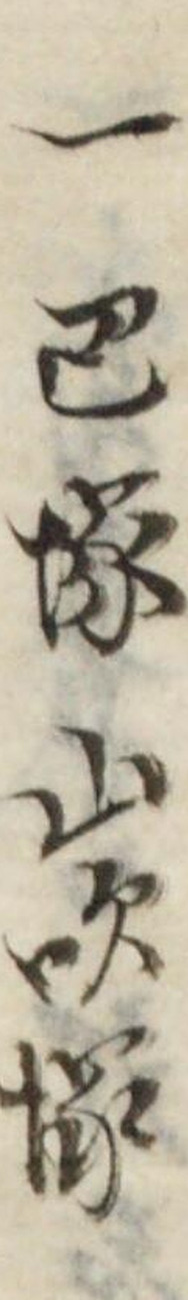一巴塚山吹塚
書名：加越能旧聞録
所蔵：Ishikawa Prefectural Library
